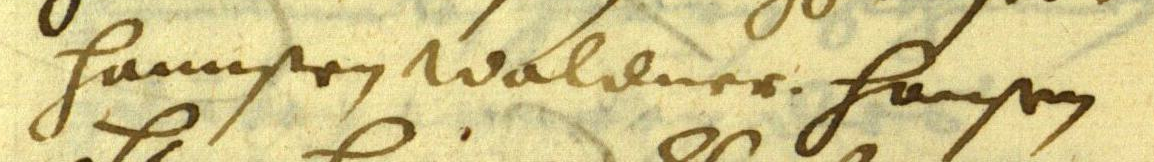hannsen Waldner. hansen
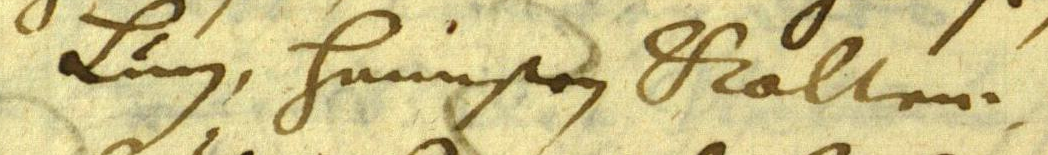Lūn, hannsen Kalten¬
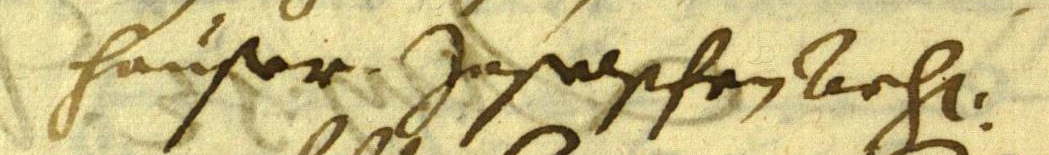haūser. Joseffen Acht¬
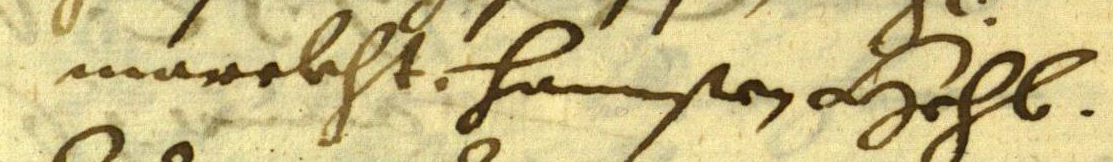marckht. hannsen Hehl.
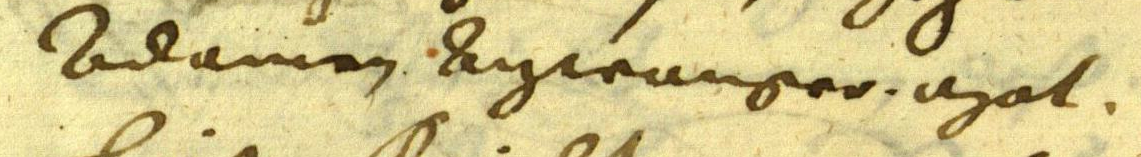Adamen Azwannger. Mat¬
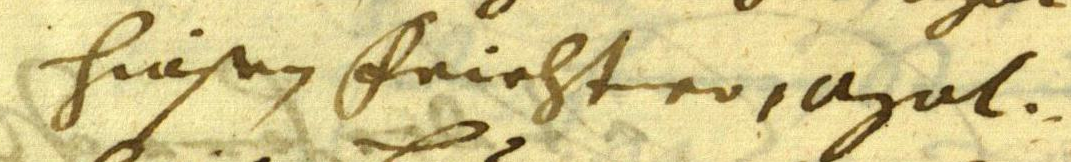hiasen Feichtner, Mat¬
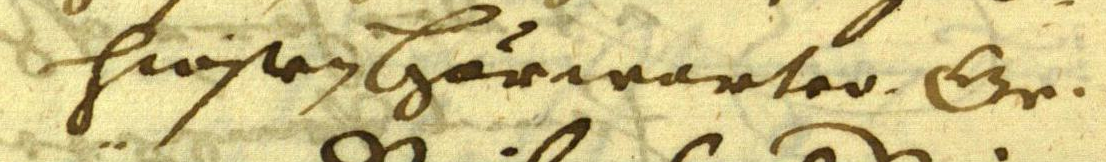hiasen Hōrwarter. Ge¬
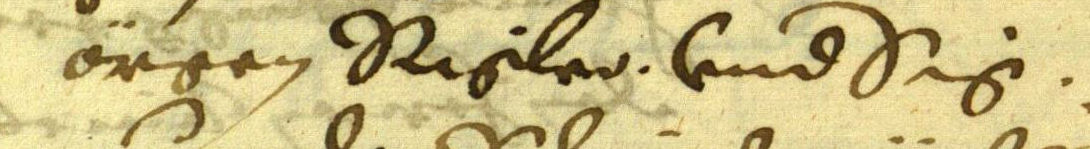örgen Rigler. vnd Sig¬
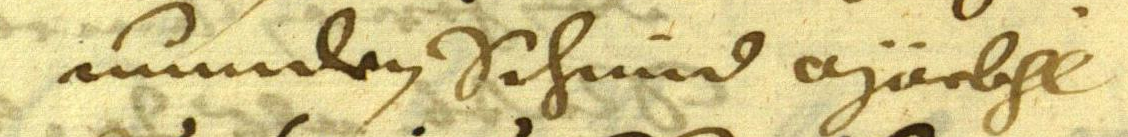mūnden Schmid Mäckhl
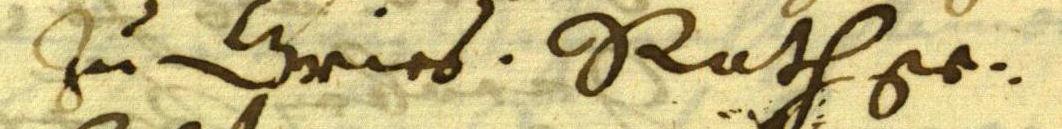Zū Gries. Rath ge¬
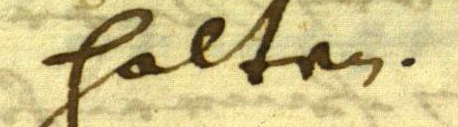halten.
